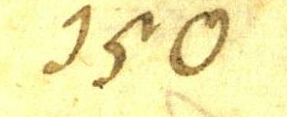150
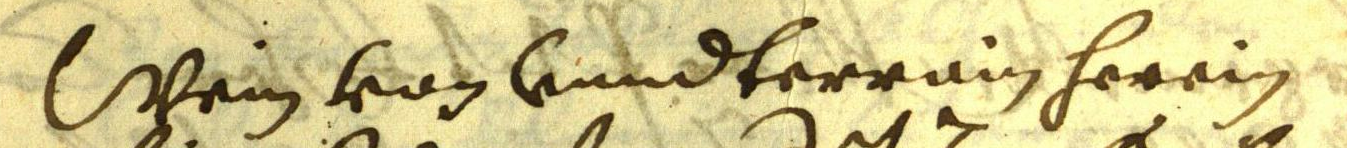Wein von vnndterrain herein
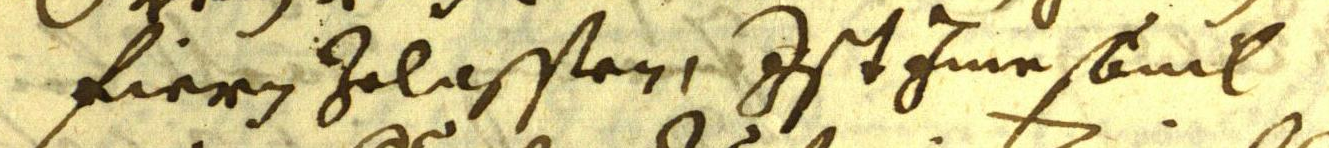fiern Zelassen, Ist Ime sovil
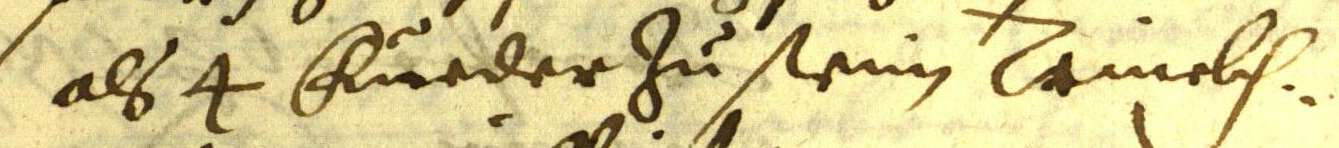als 4 Fūeder Zū sein Trinckh¬
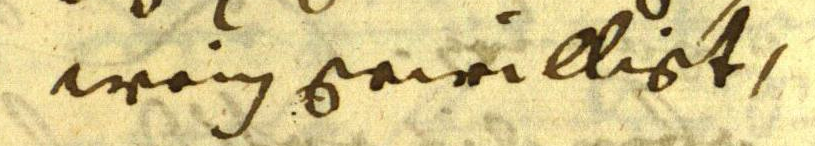wein gewilligt,
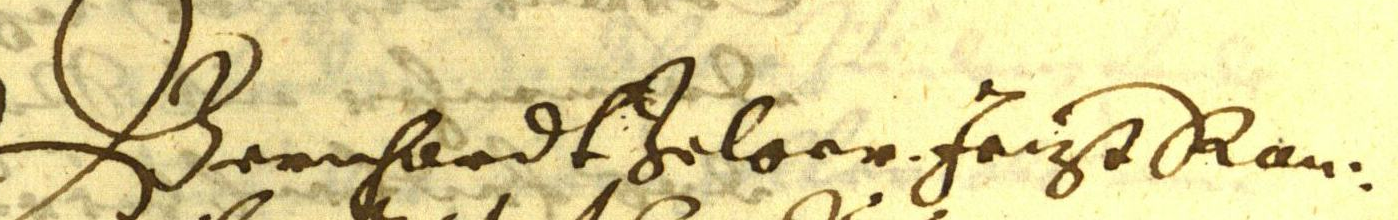Bernhardt Zelger. Jezt Ran¬
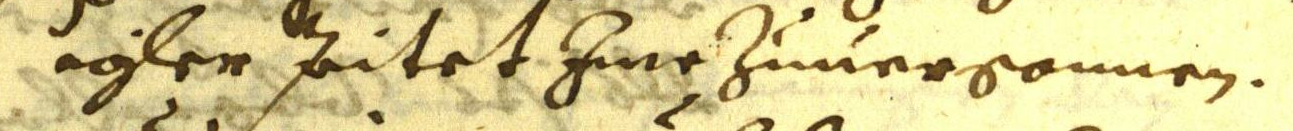igler Pitet Ime Zūūergonnen.
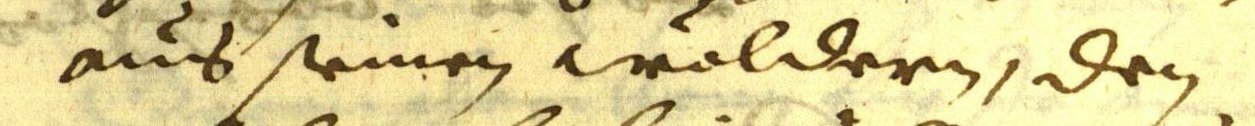aūs seinen wāldern, den
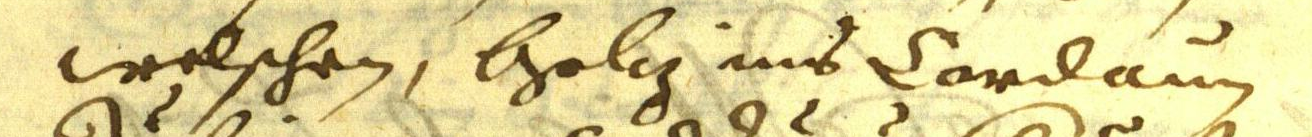welschen, holz ins Cardaūn
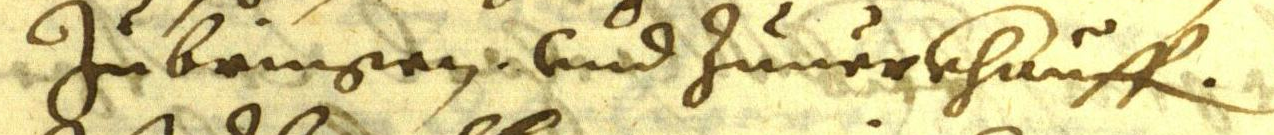Zū bringen. vnd Zūūerkhaūff.
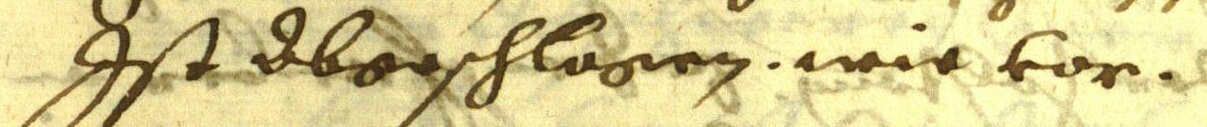Ist Abgeschlagen. wie vor.
